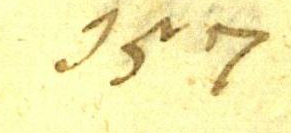157
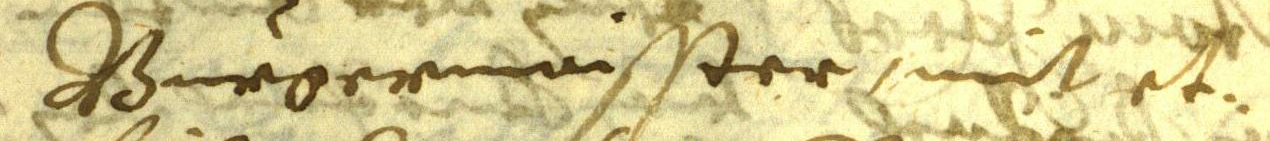Būrgermaisster, mit et¬
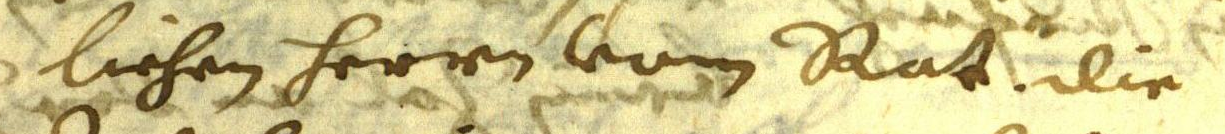lichen herrn vom Rat. die
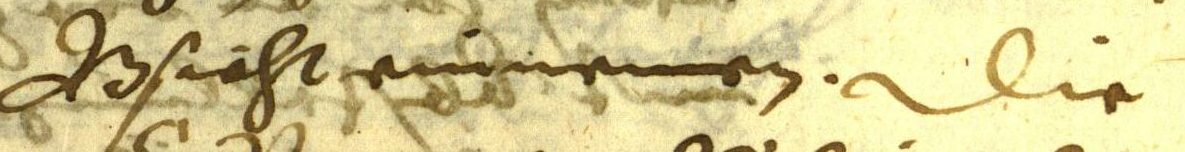Bsicht einnemen. Die
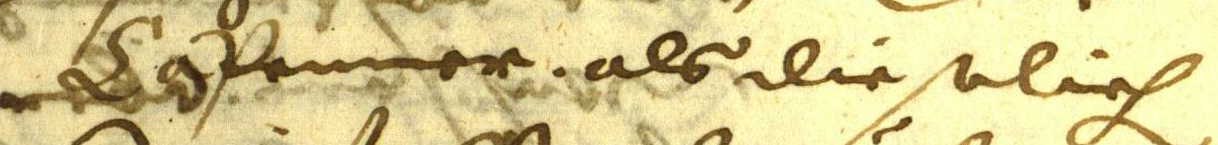CaPenner. als die solich
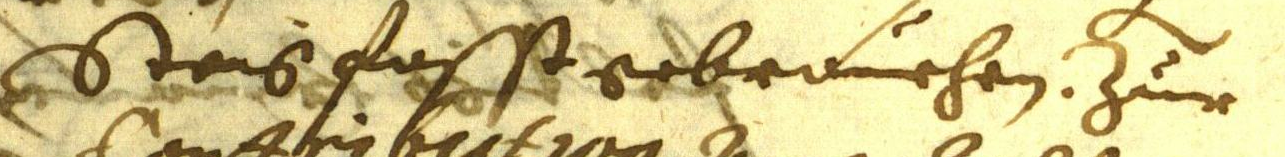Steig fasst gebraūchen. Zūr
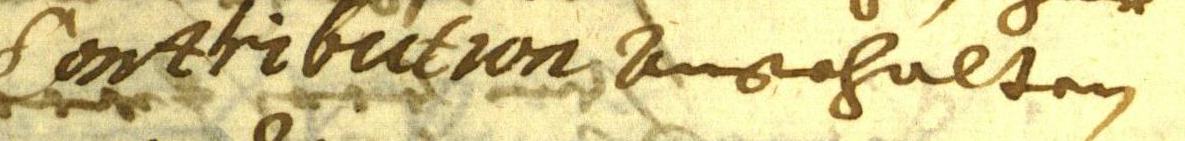Contribution Angehalten
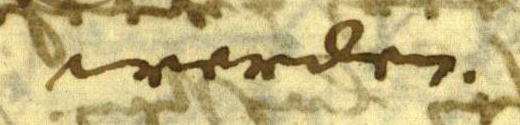werden.
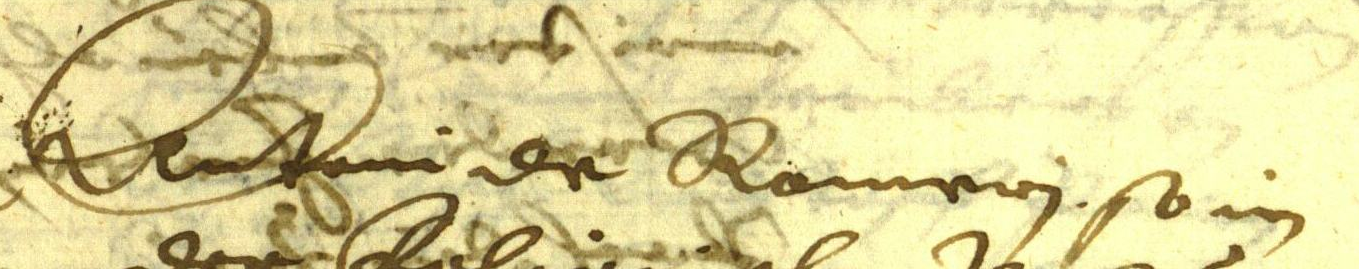Antoni de Romerj. so in
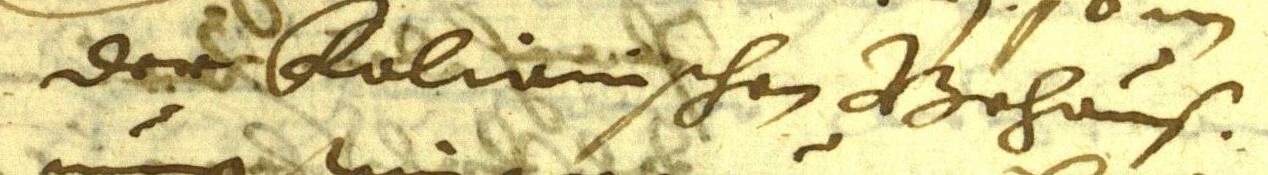der Folianischen Behaūs¬
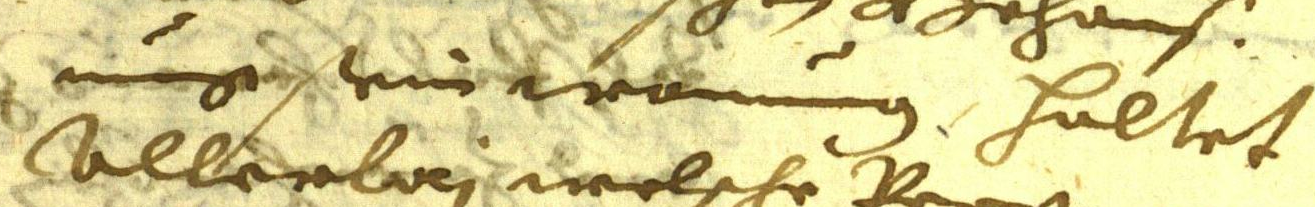ūng sein wonūng haltet
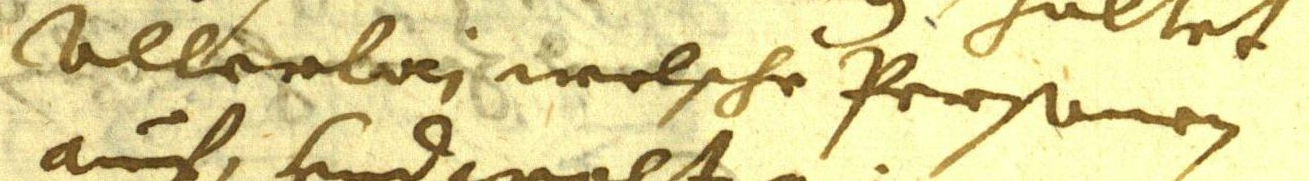Allerlei welsche Personen
